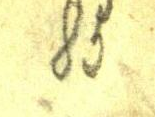85
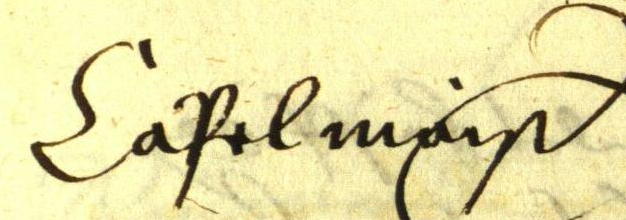CaPelmaist
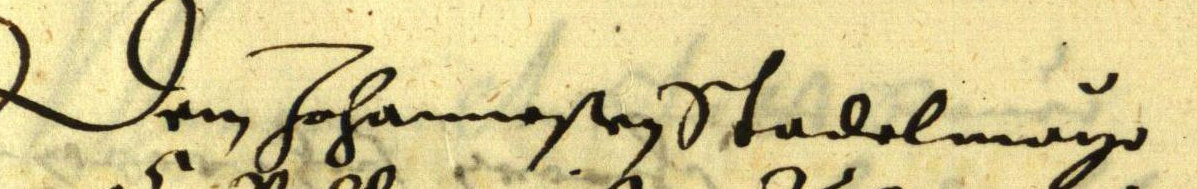Dem Johannesen Stadelmaȳr
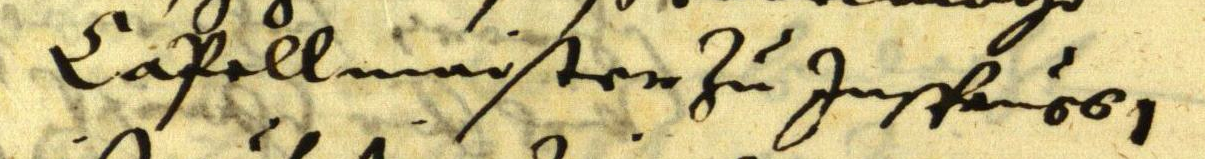CaPellmaister Zū InsPrūgg,
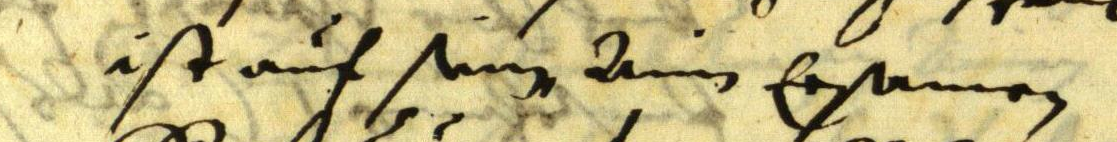ist aūf sein Aim Ersamen
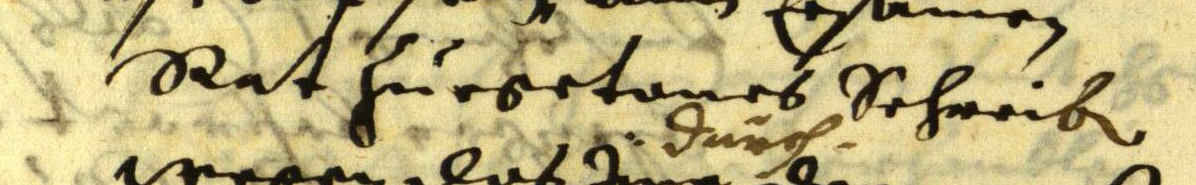Rat Zūegetanes Schreib
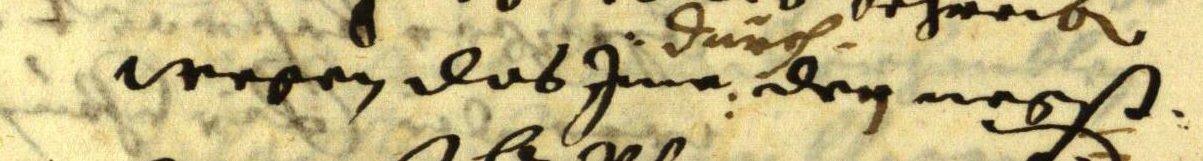wegen das Ime dūrch den negst¬
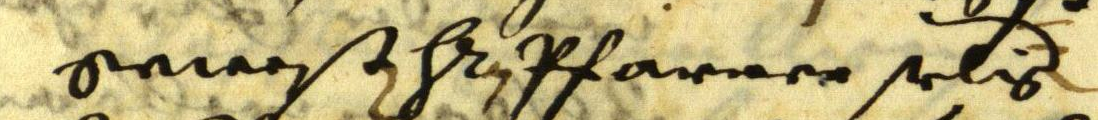gewesten h Pfarrer selig
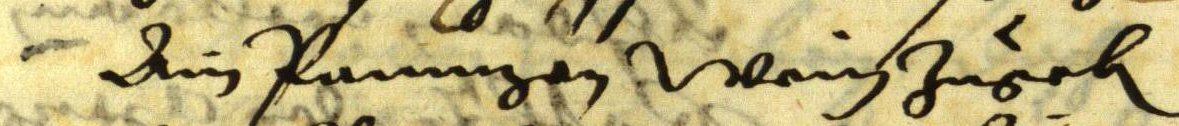Ain Pannzen Wein Zūgeb
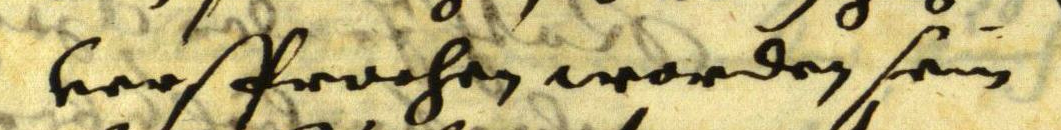versProchen worden sein
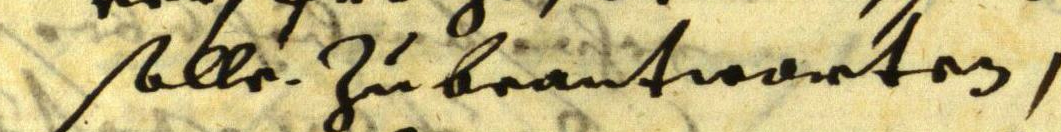solle. Zū beantworten,
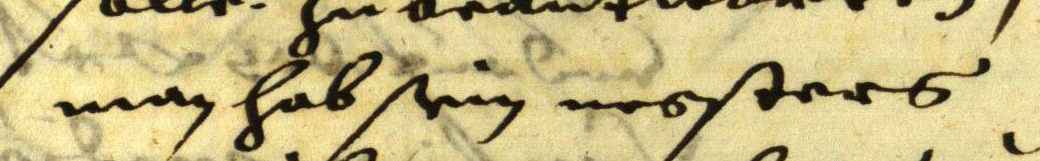man hab sein negsters
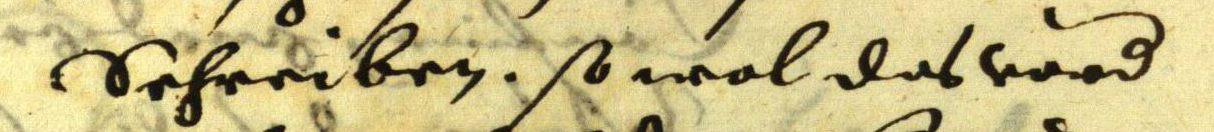Schreiben. so wol das vord
